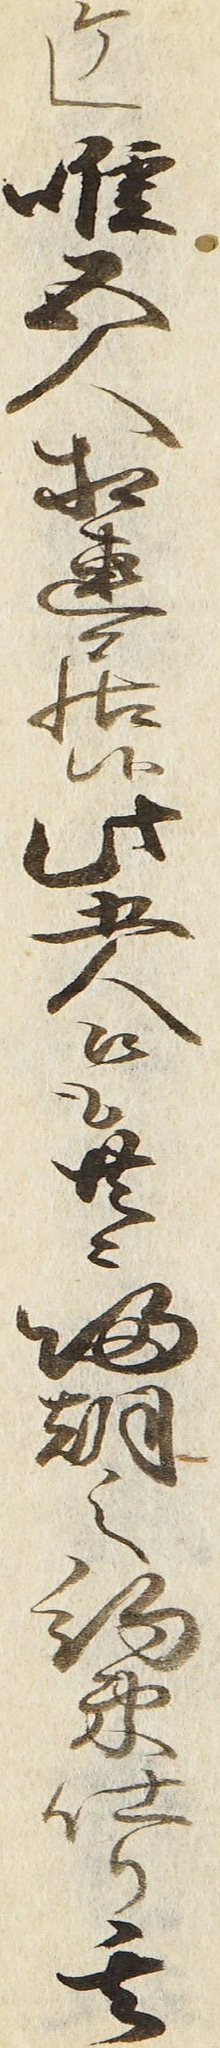ケ」唯五人相連居候此五人江も共々帰朝之約束仕り其
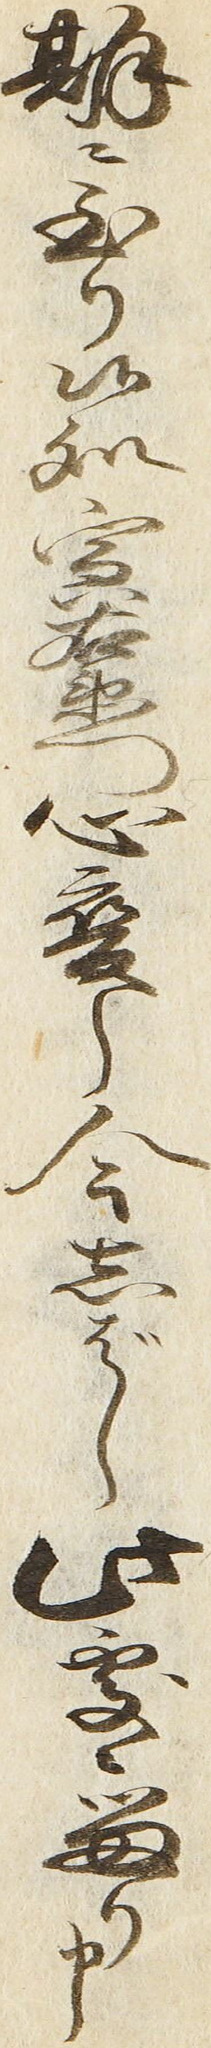期ニ至り候処寅右衛門心変し今しばし此處ニ留り申
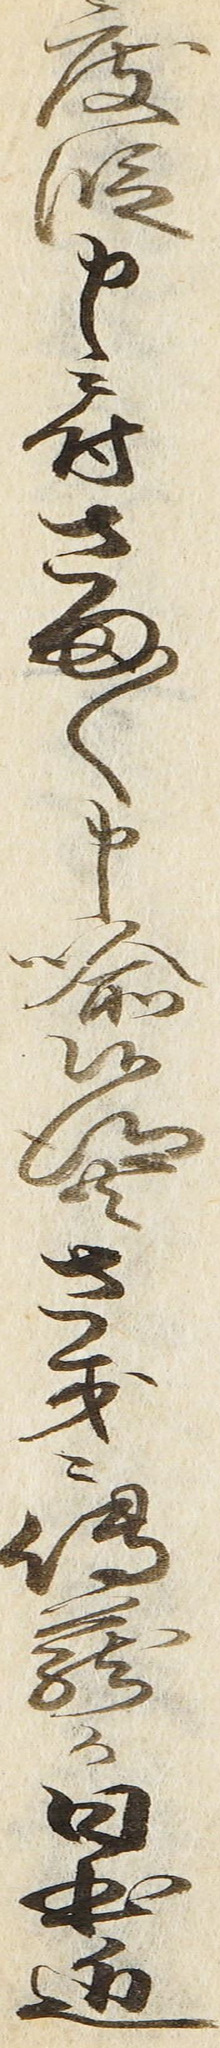度段申ニ付さま〳〵申喩候得共さきニ傳蔵か日本近
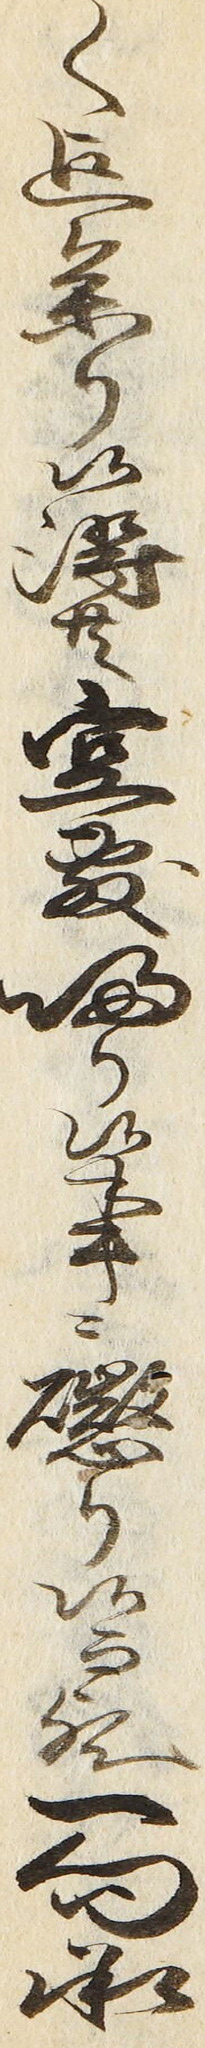く迄参り候得共空敷帰り候事ニ懲り候而欤一向承
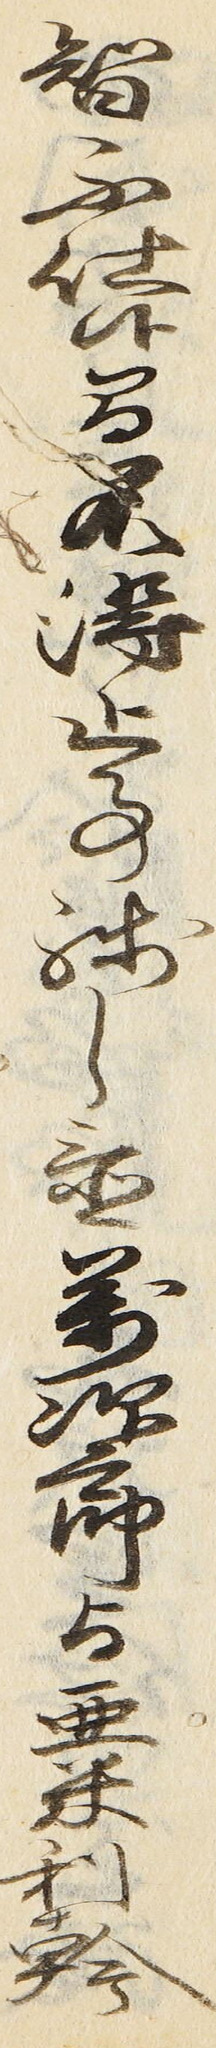智不仕候間不涛止事残し置萬次郎と亜米利幹
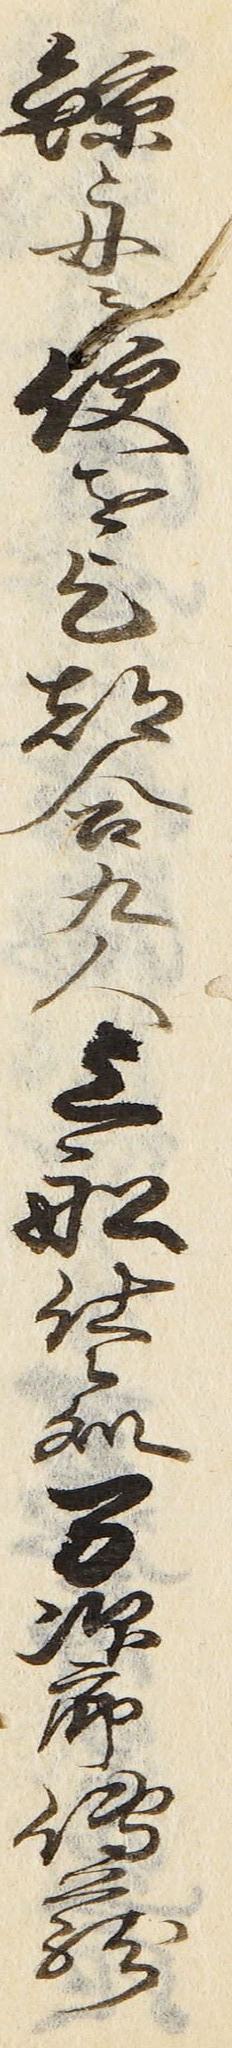鯨舟ニ便を乞都合九人上舩仕候処万次郎傳蔵
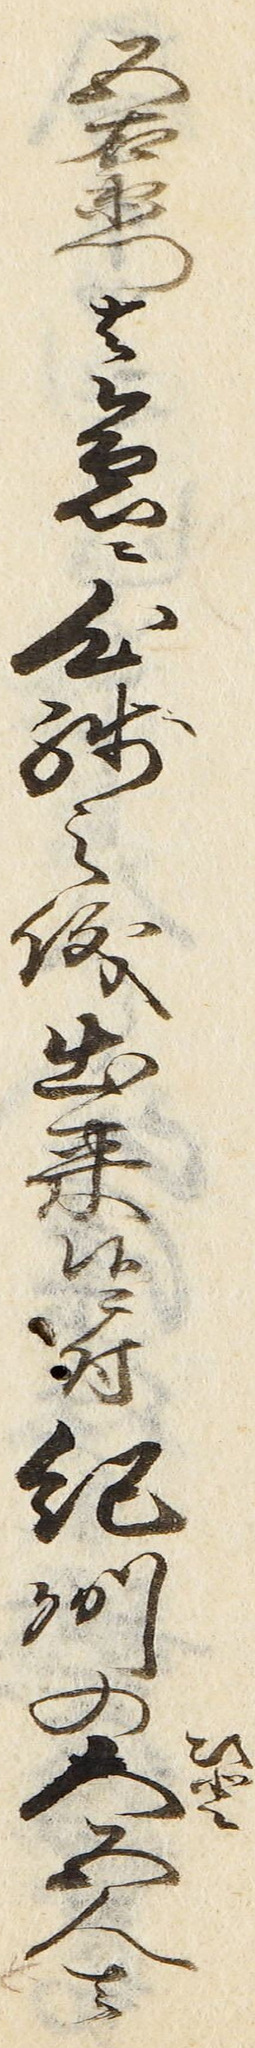五右衛門者急ニ心残之儀出来候ニ付紀州の人五人者
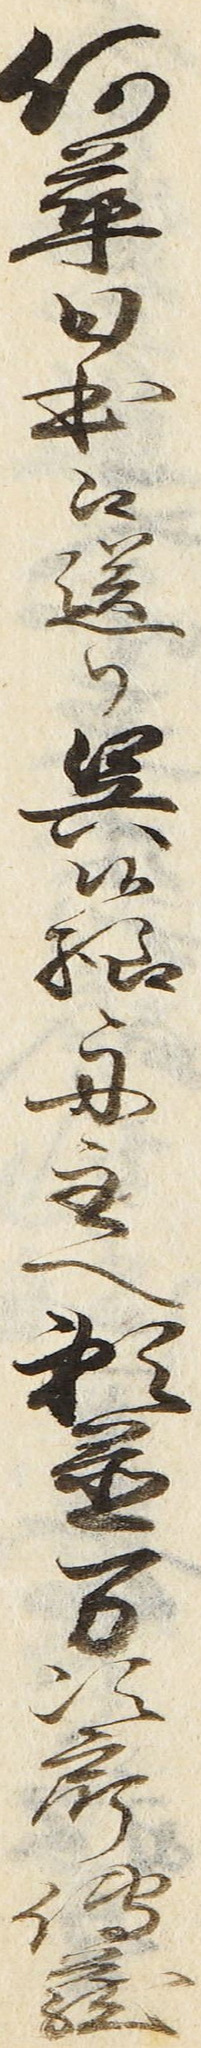何卒日本江送り呉候様舟主へ頼置万次郎傳蔵
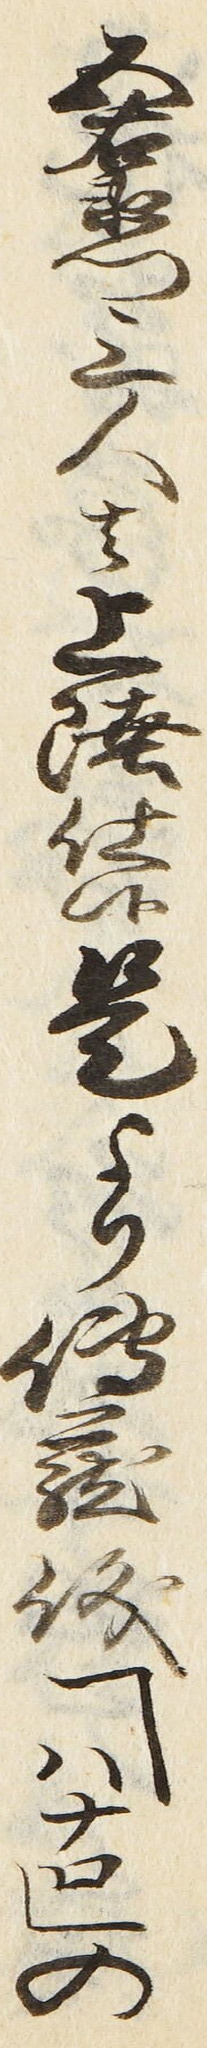五右衛門三人者上陸仕候是より傳蔵儀「ハナロ」の
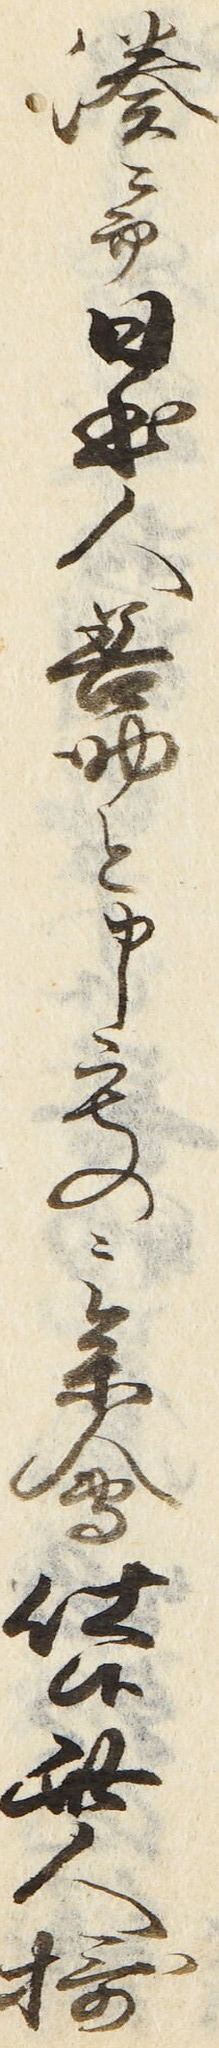湊ニ而日本人善助と申ものニ参會仕候此人摂
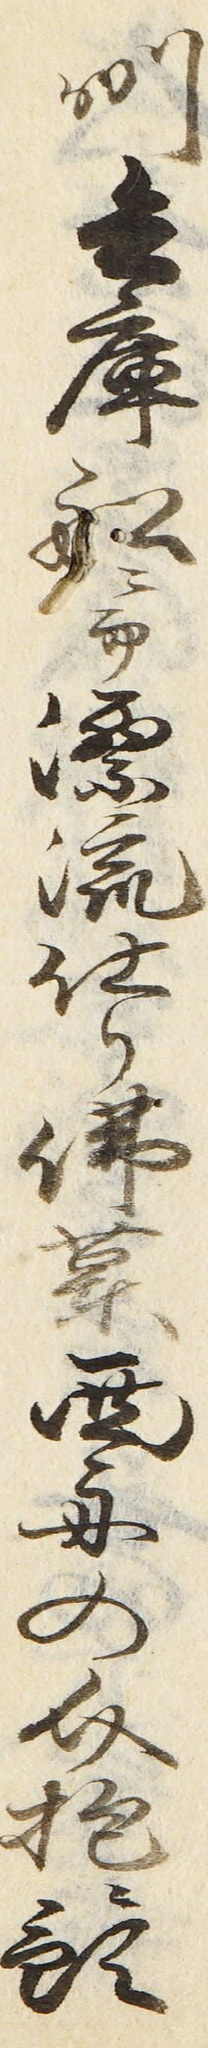州兵庫舩ニ而漂流仕り佛蘭西舟の介抱ニ預
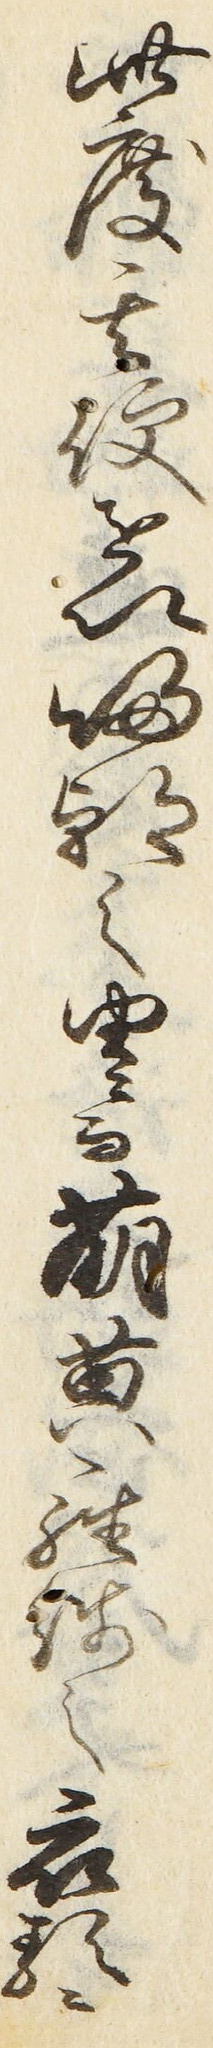此度其便を以帰朝之由にて萌黄羅紗之衣類ニ
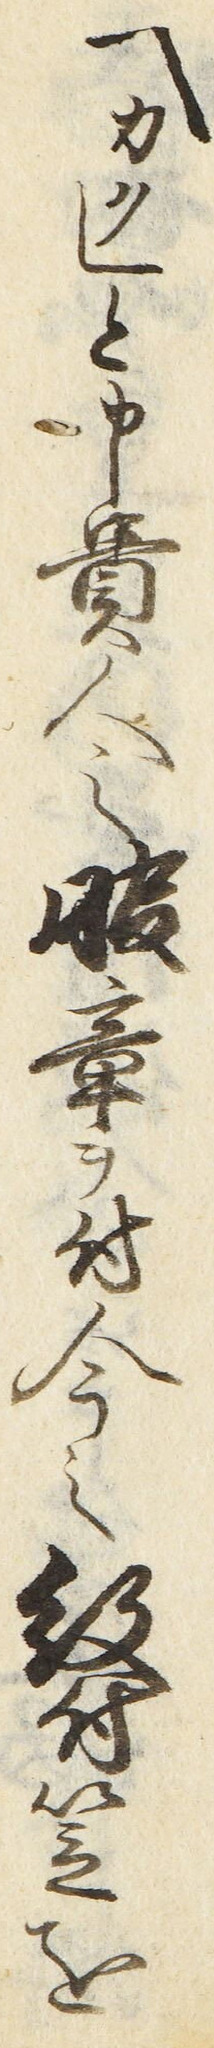「カク」と申貴人之服章ヲ付今之紋付笠を
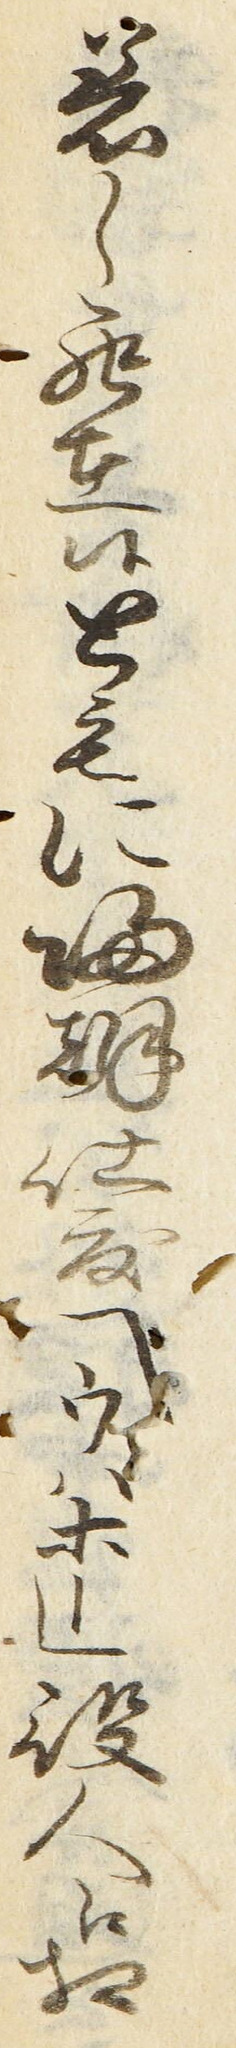着し罷在候ともに帰朝仕度「ウハホー」役人江相

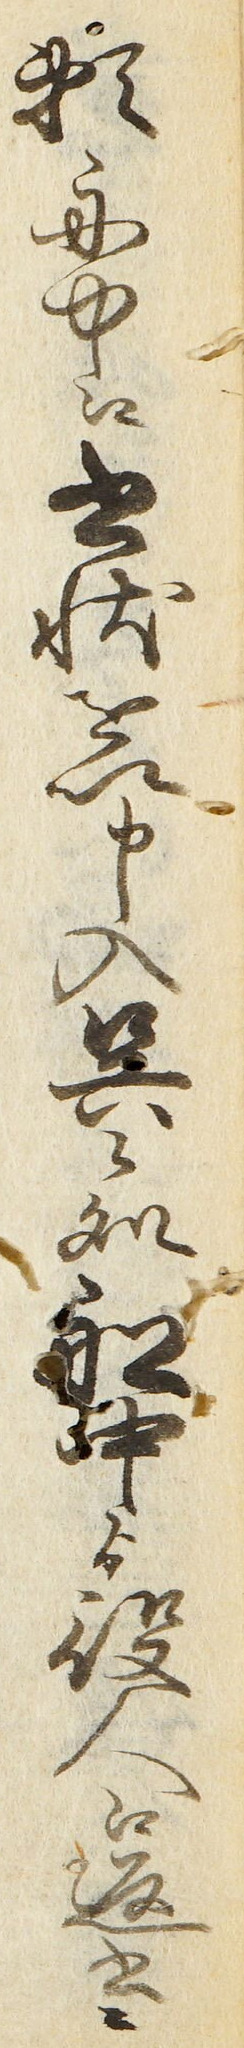頼舟中江書状を以申入呉候処舩中ゟ役人江返書ニ
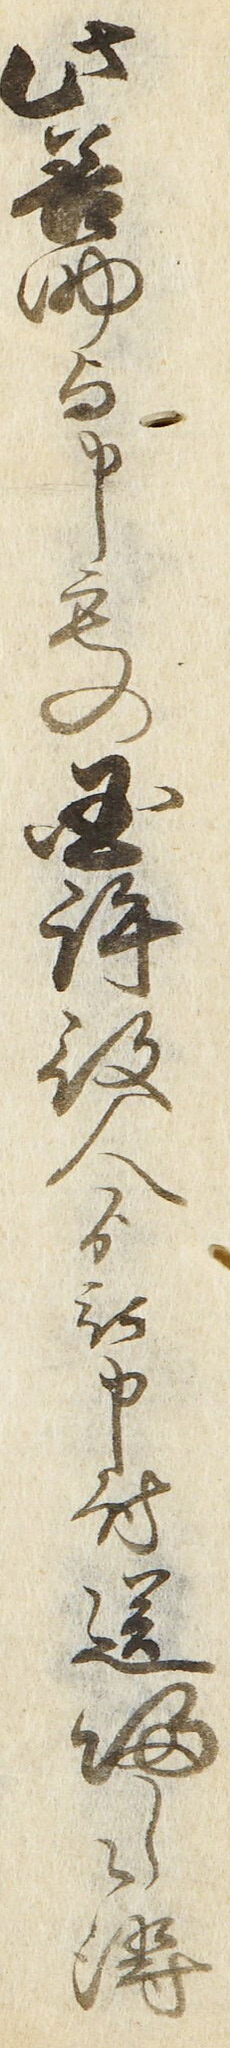此善助と申もの国許役人ゟ被申付送帰し候得
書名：漂客談寄
